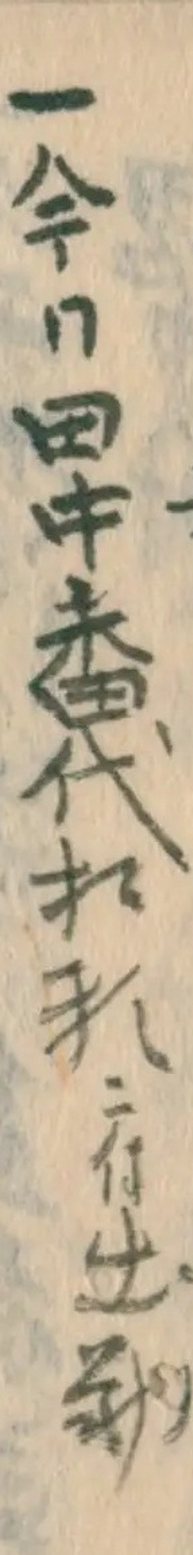一今日田中番代相頼ニ付出勤
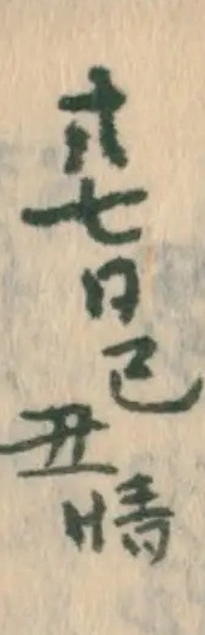廿七日己丑晴
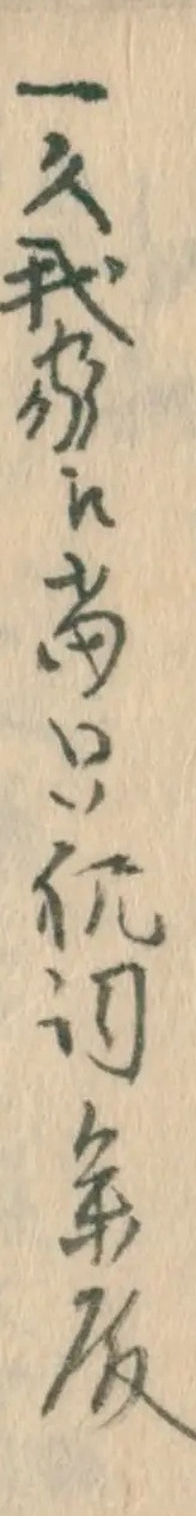一久我家え当日御祝伺参殿
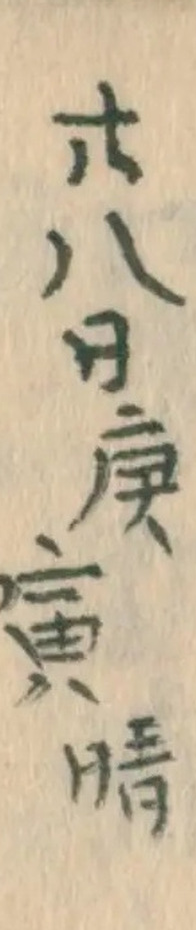廿八日庚寅晴
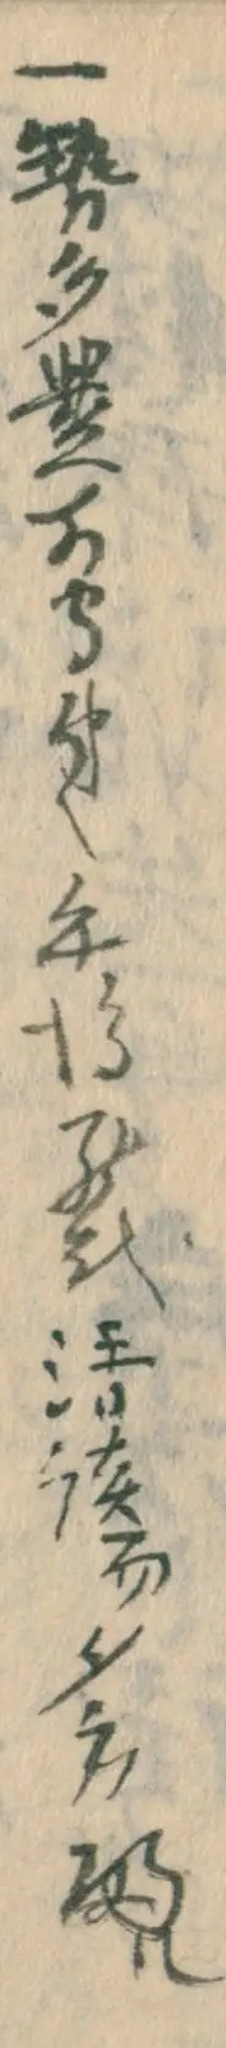一勢多豊前守第へ午後罷越清談而夕方帰ル

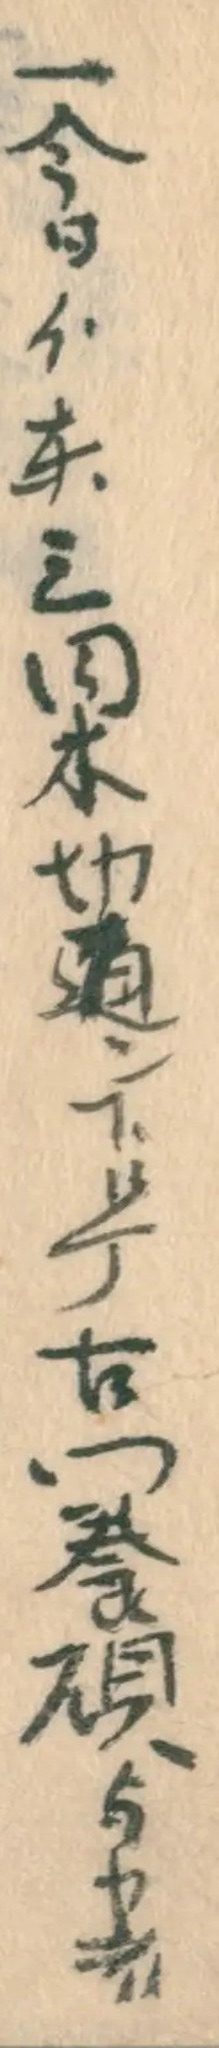一今日ゟ東三田木切通シ下ル丁古門養硯と申者
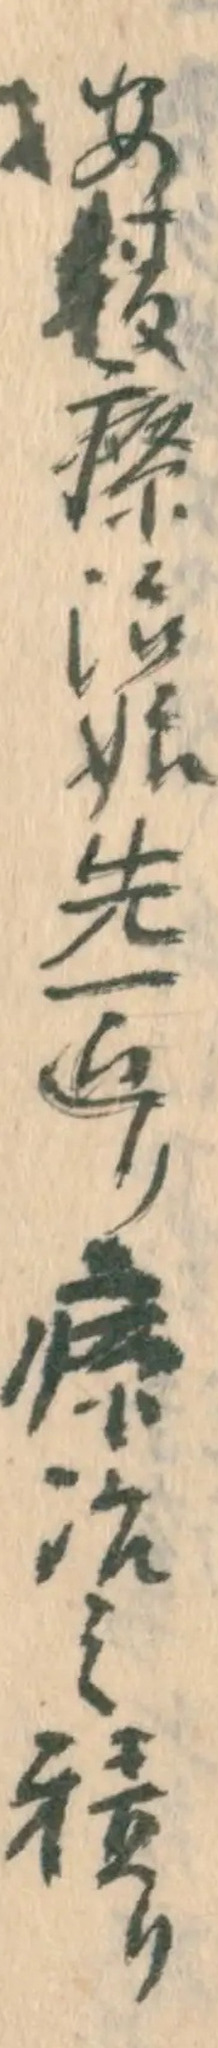按腹療治始先一廻り療治之積り
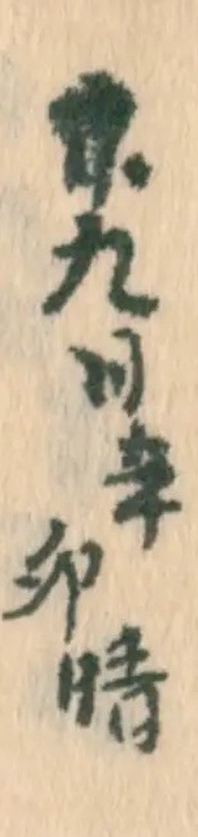廿九日辛卯晴
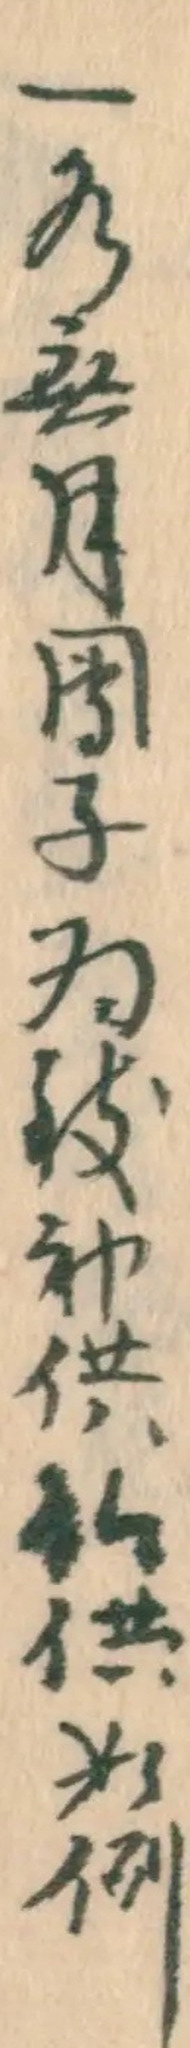一水無月団子為致神供仏供如例
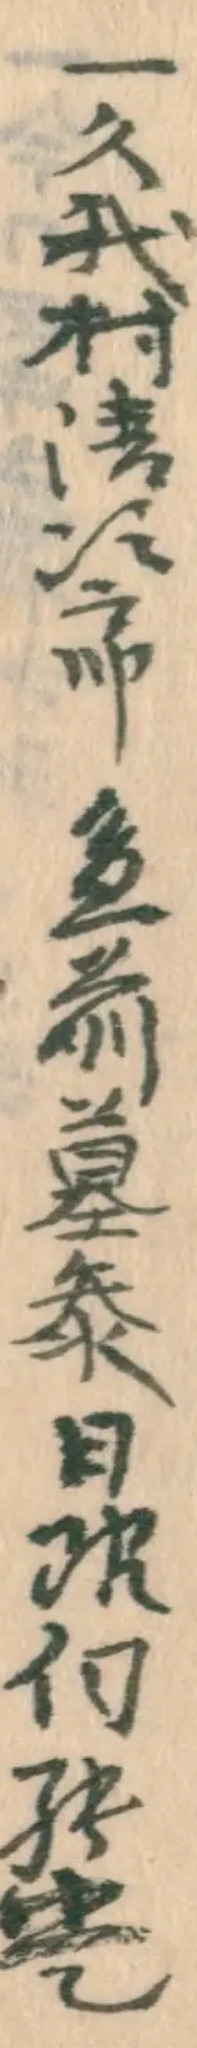一久我村清次郎盆前墓参日限伺罷出て
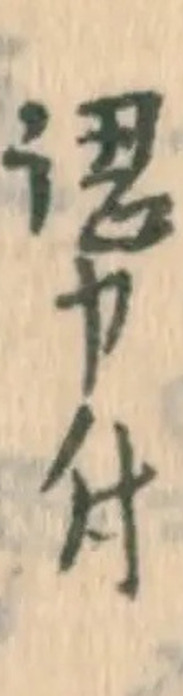認申付
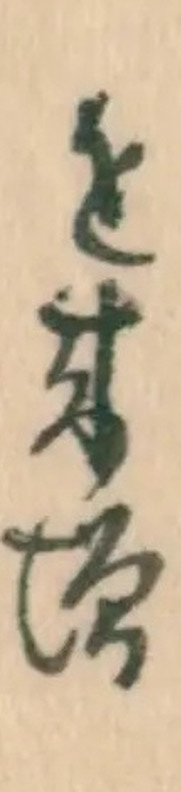を来増
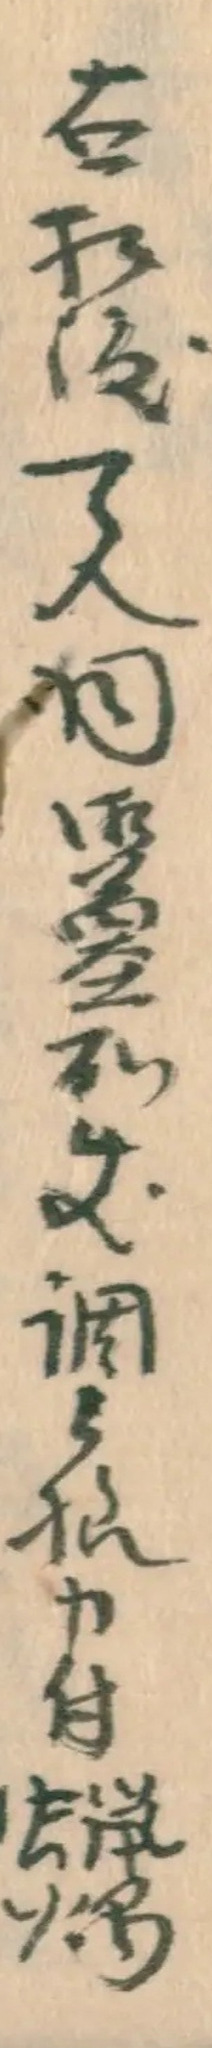右相渡一人目御墓所丈調候様申付蝋燭
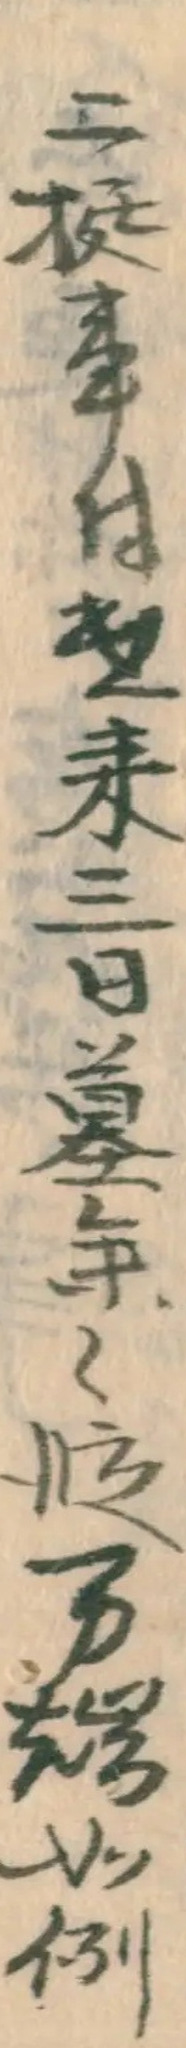二挺事付遣来三日墓参候段万端如例
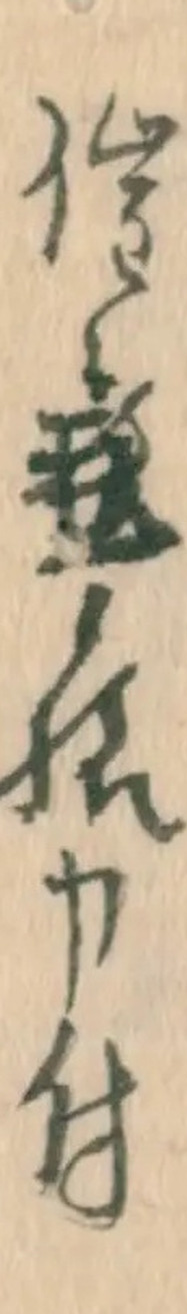催候様申付
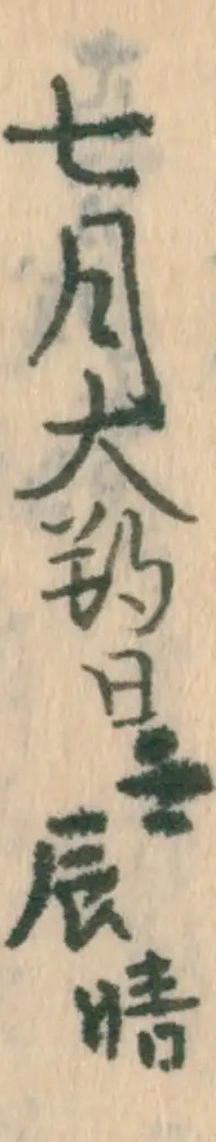七月大朔日壬辰晴
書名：禁裏御所御用日記. [131]
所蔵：国立国会図書館 National Diet Library, JAPAN
